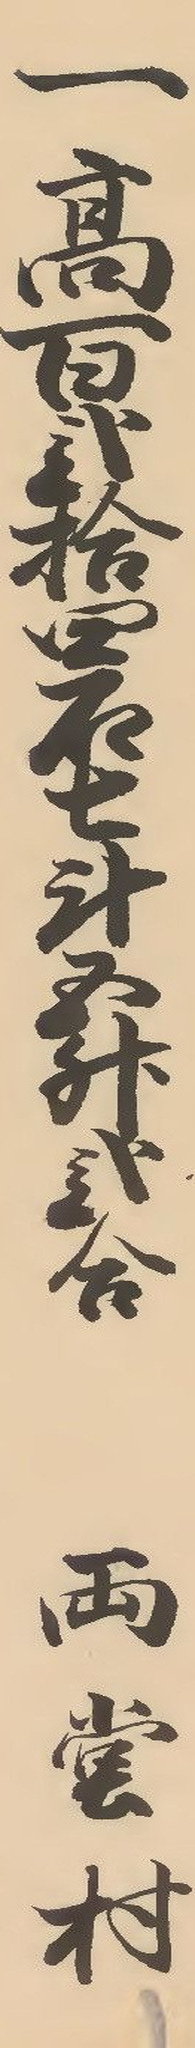一高百弐拾四石七斗五升弐合両堂村
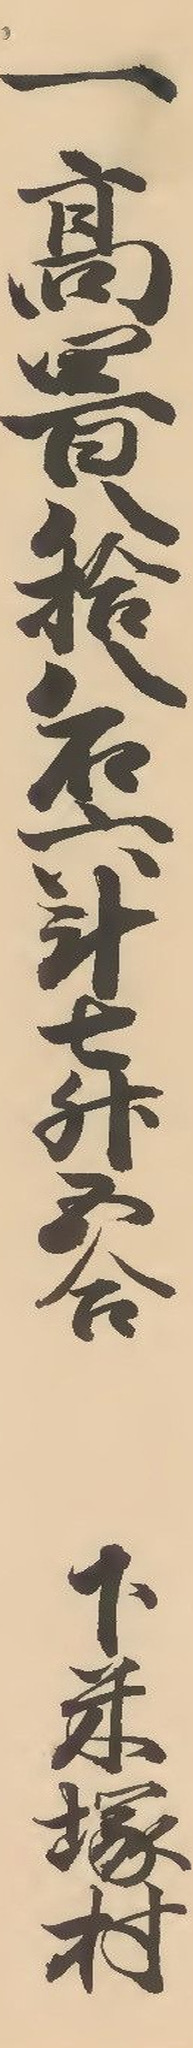一高四百八拾八石六斗七升五合下米塚村
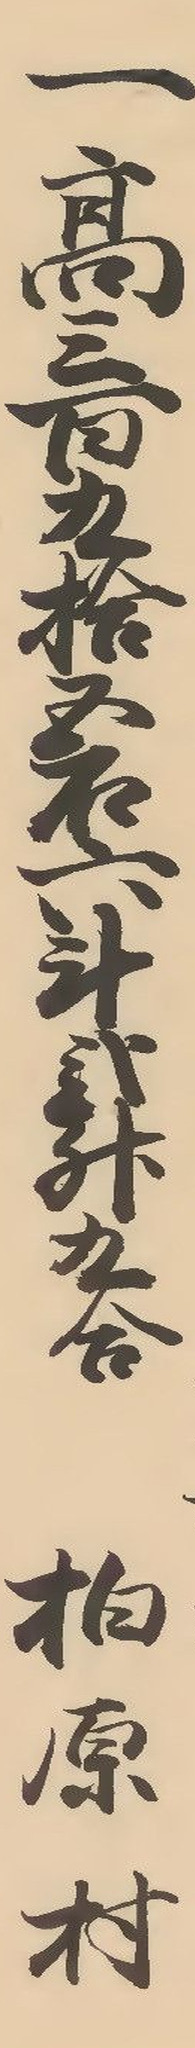一高三百九拾五石六斗弐升九合柏原村
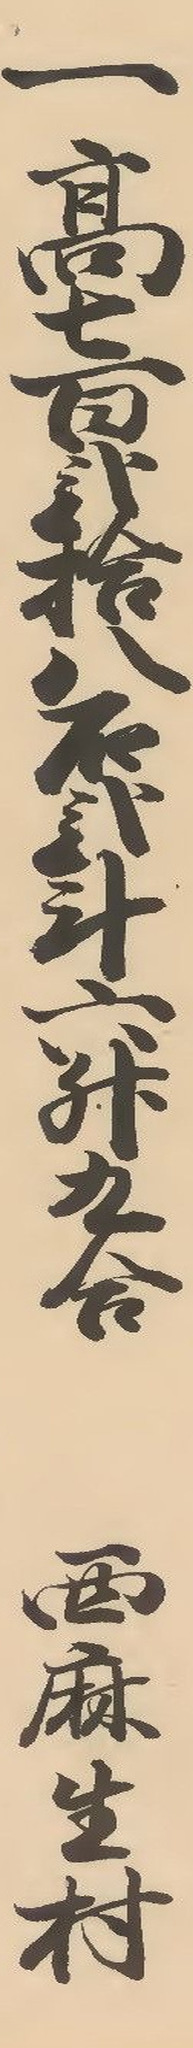一高七百弐拾八石弐斗六升九合西麻生村
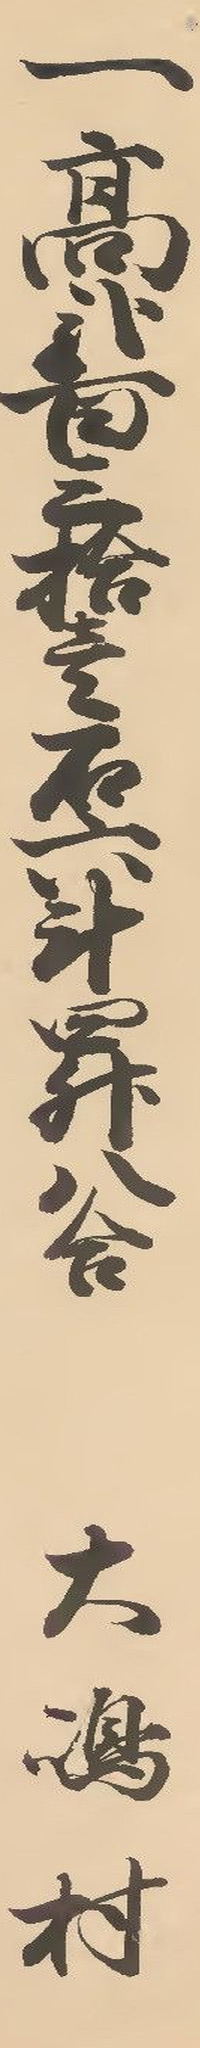一高弐百三拾壱石六斗四升八合大島村
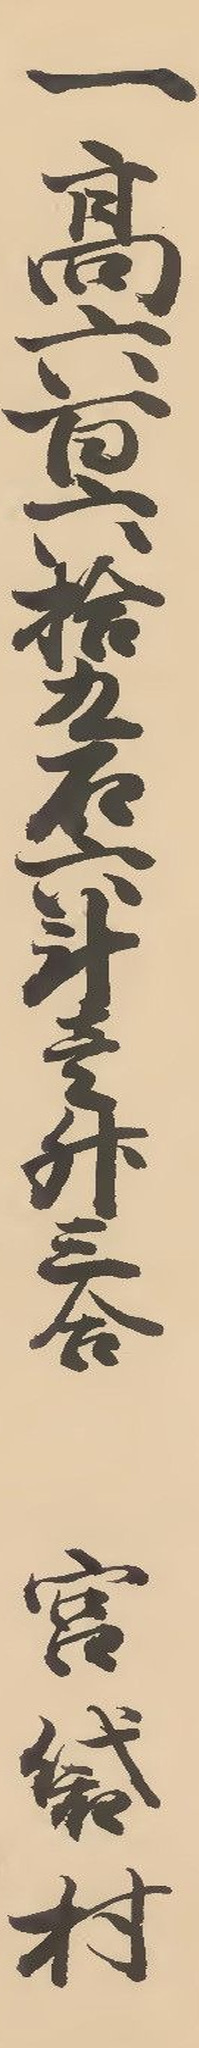一高六百六拾九石六斗壱升三合宮袋村
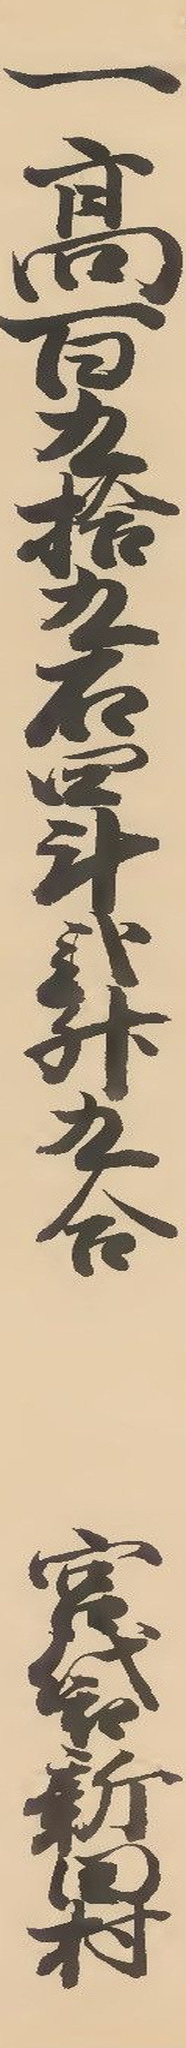一高百九拾九石四斗弐升九合宮袋新田村
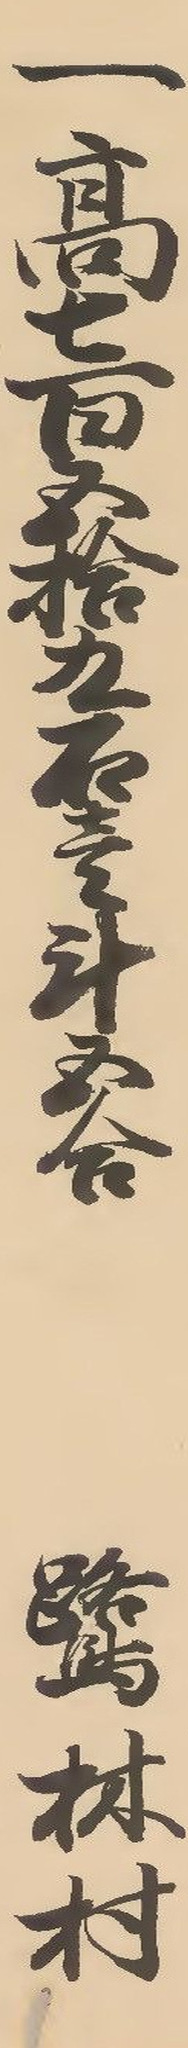一高七百五拾九石壱斗五合鷺林村

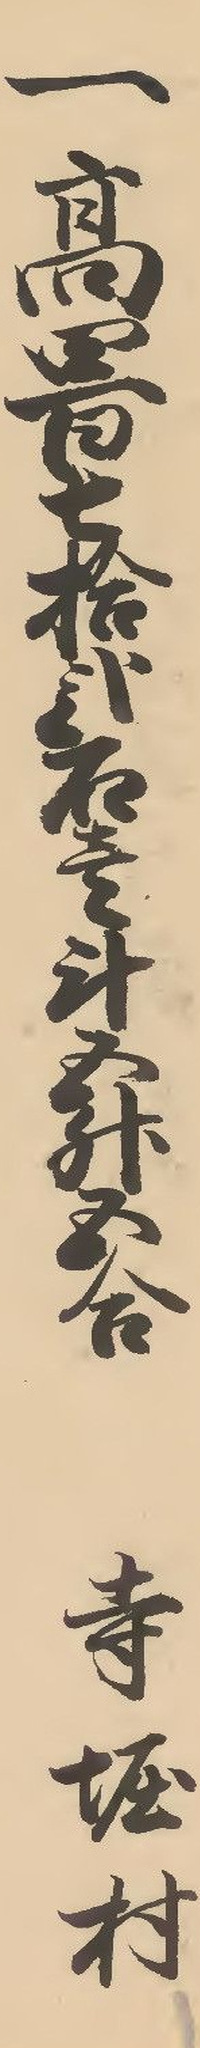一高四百七拾弐石壱斗五升五合寺堀村
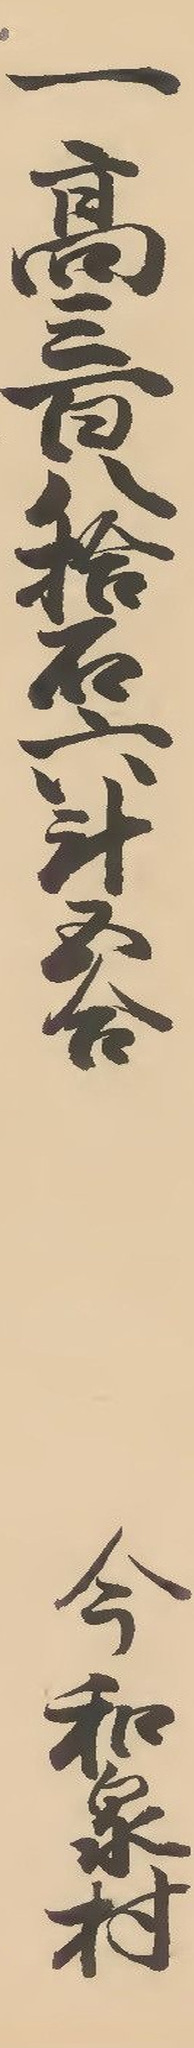一高三百八拾石六斗五合今和泉村
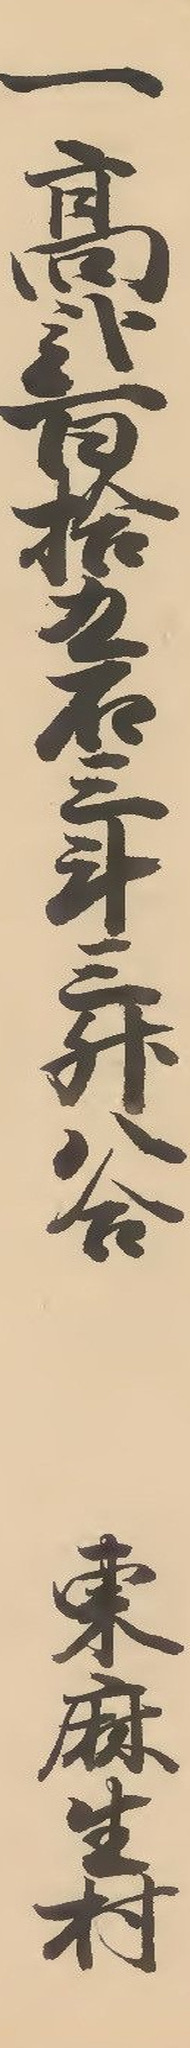一高弐百拾九石三斗三升八合東麻生村
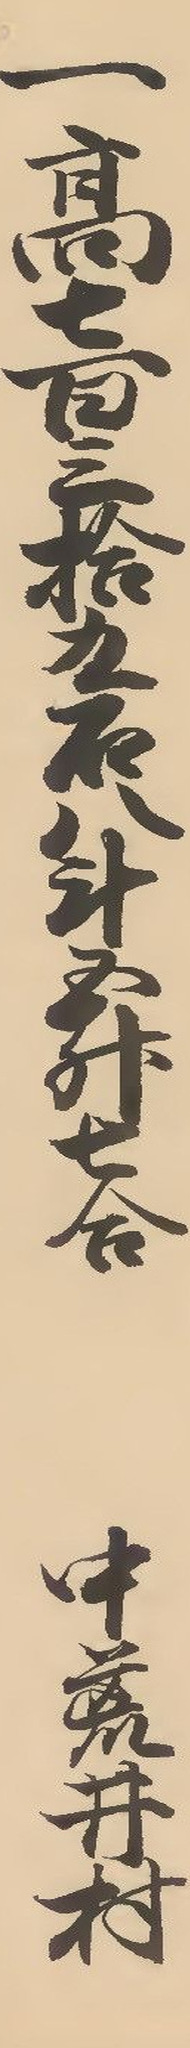一高七百三拾九石八斗五升七合中荒井村
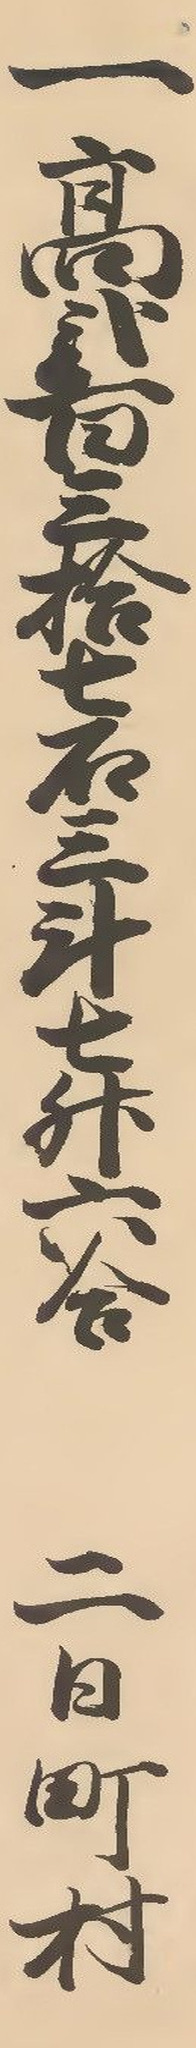一高弐百三拾七石三斗七升六合二日町村
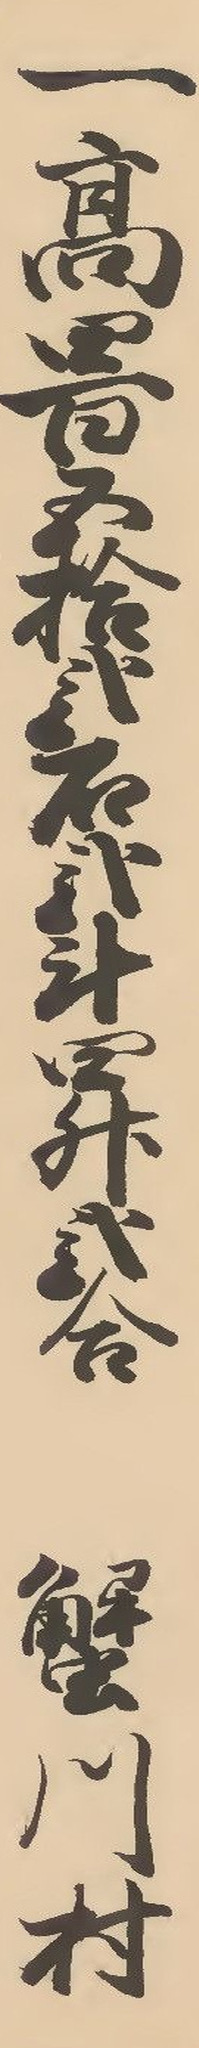一高四百五拾弐石弐斗四升弐合蟹川村
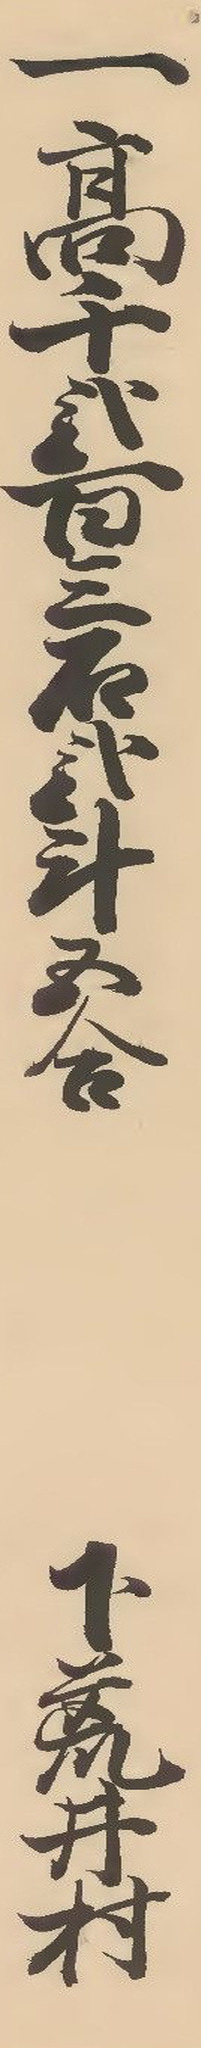一高千弐百三石弐斗五合下荒井村
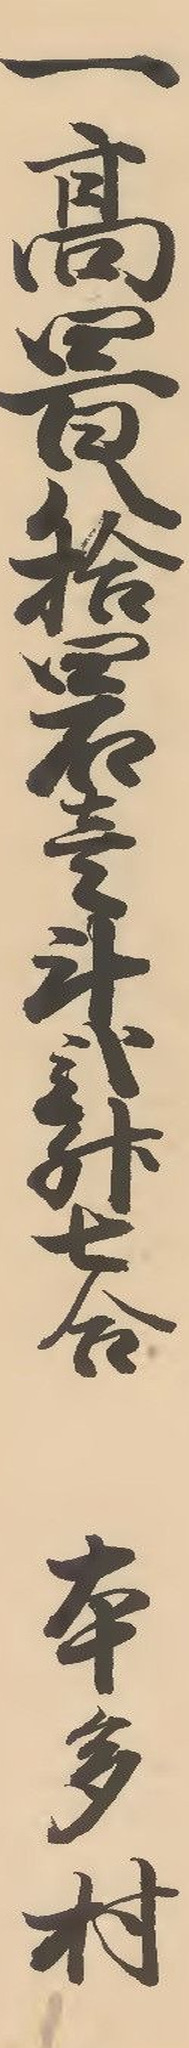一高四百八拾四石壱斗弐升七合本多村
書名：陸奥国郷帳　１
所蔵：国立公文書館 National Archives of Japan
